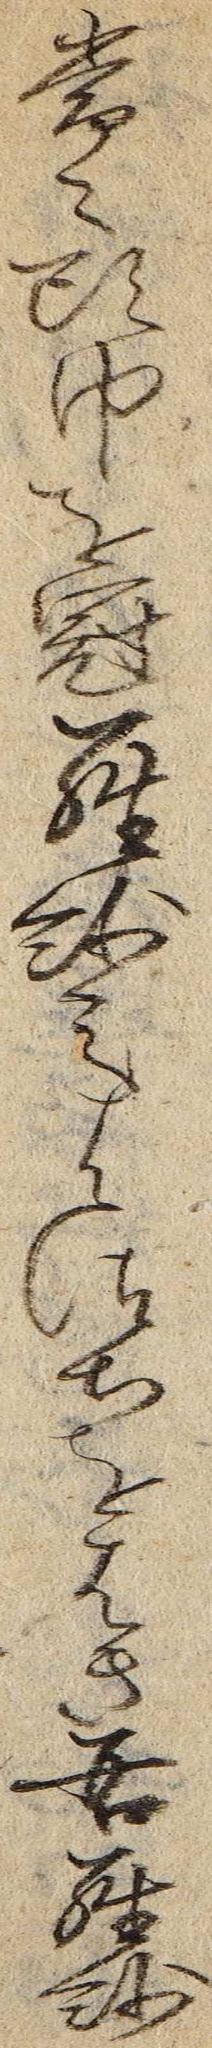常々頭巾を冠羅紗のはつちをはき居羅紗
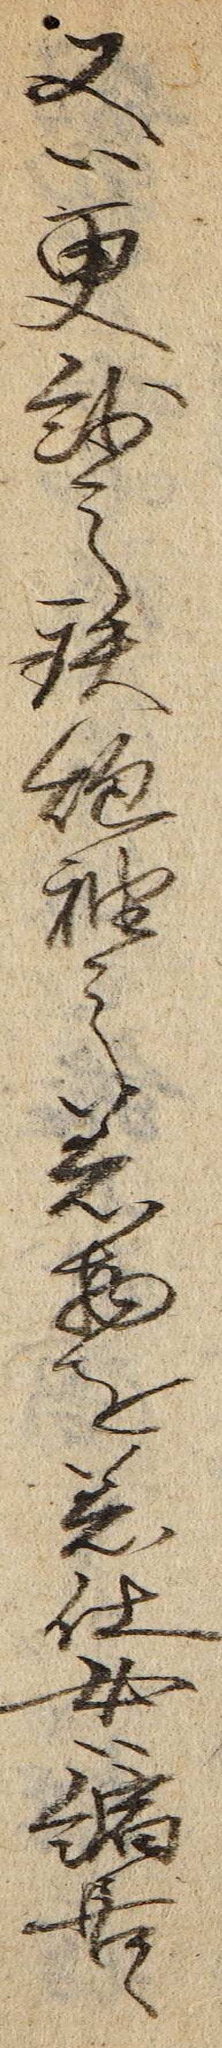又は更紗の鉄砲袖の着物を着仕女は縮居候

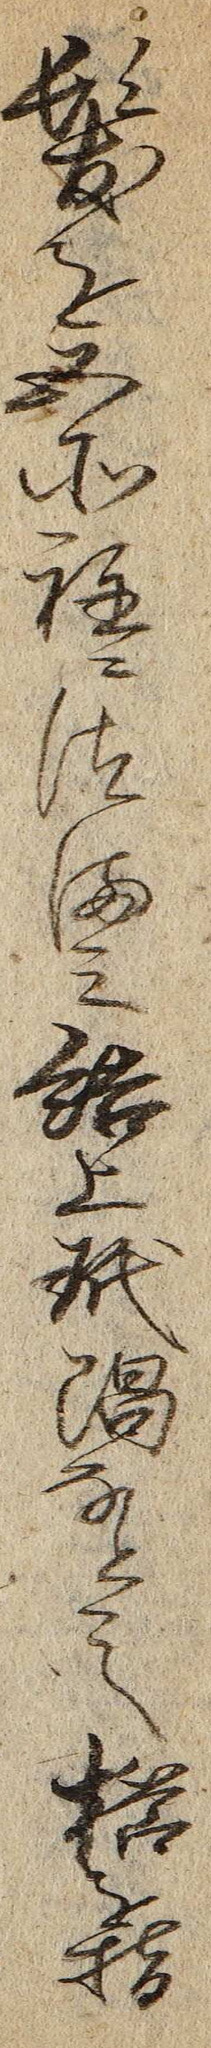髪を五所程につまみ結上玳瑁なとの櫛を指
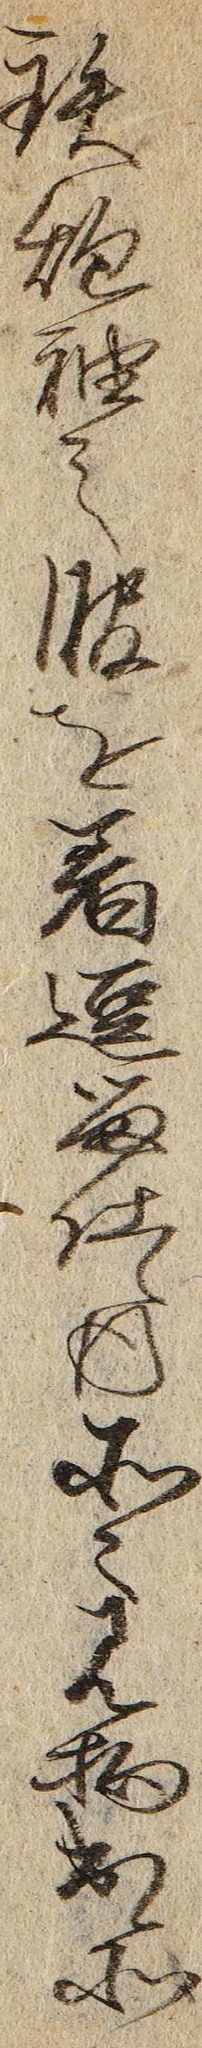鉄砲袖の服を着逗留仕候内所々見物出候所
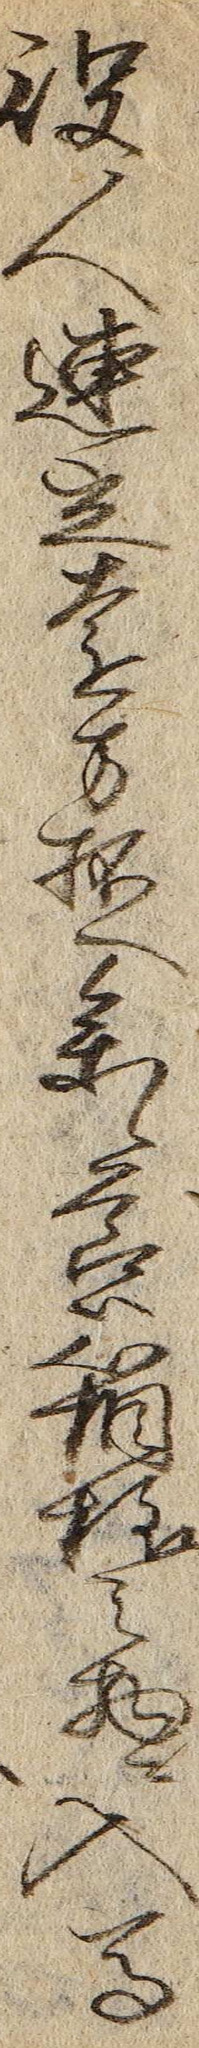役人連立遠方などへ参候節は箱様の物に入馬
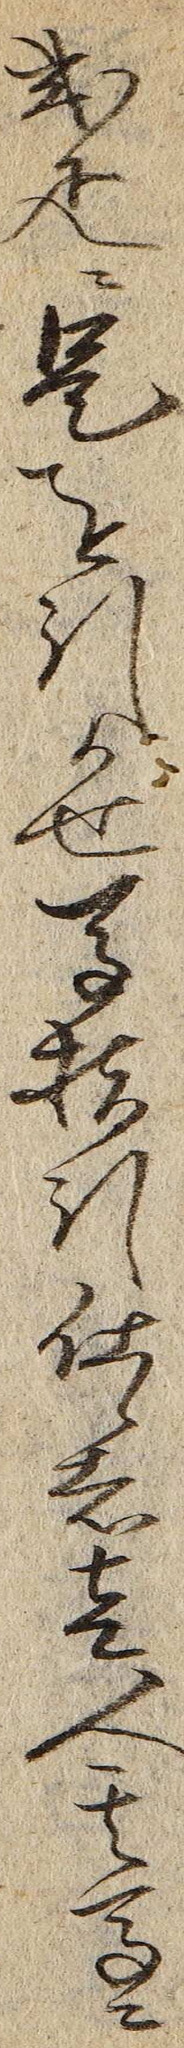二匹に是を引かせ馬指引仕候者一人其馬に
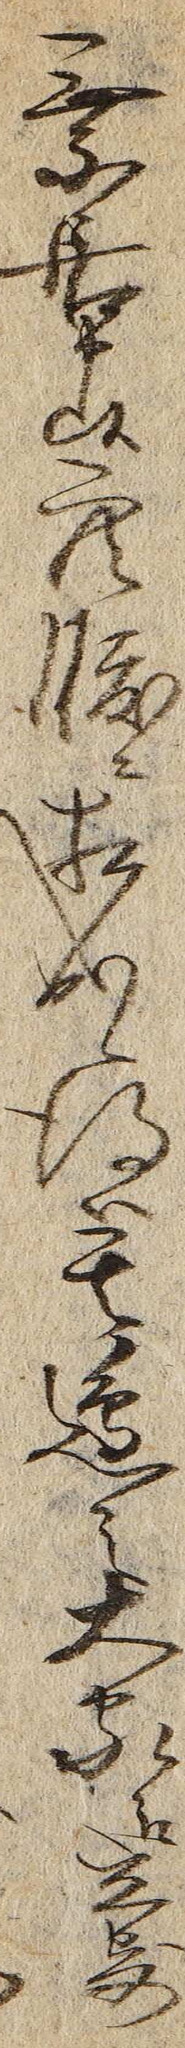乗居申候空腹に相成候得は其辺の大家へ立寄
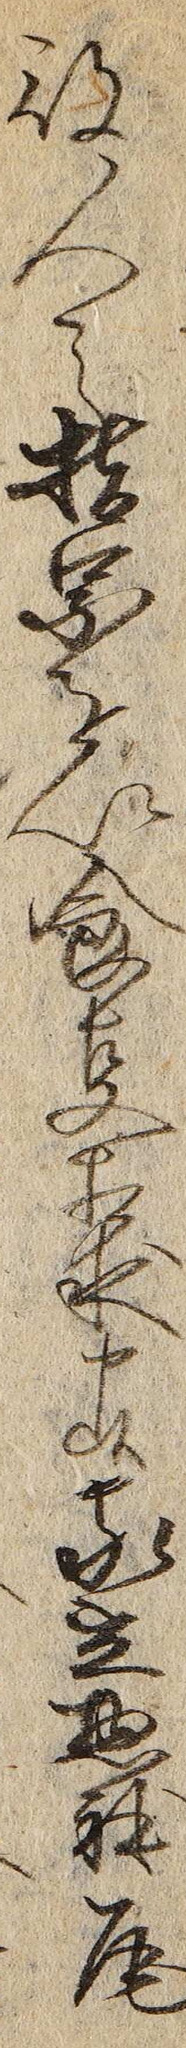役人の指図を以食事相求申候家立惣体瓦
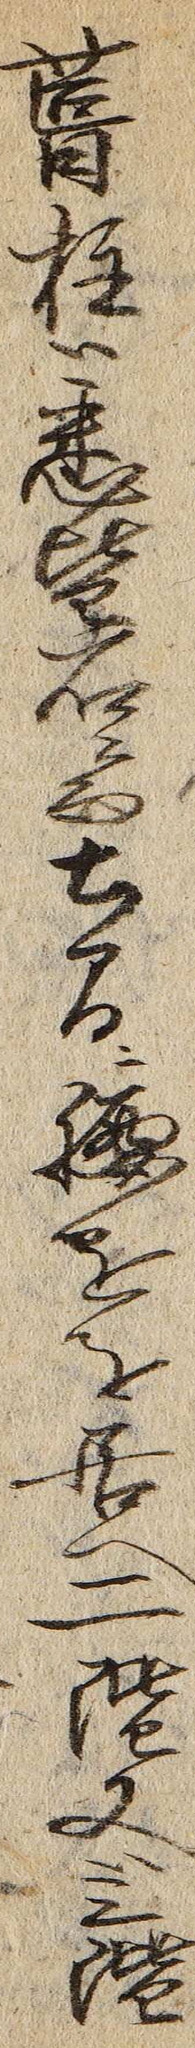葺柱は悉皆石にて土間に腰懸を居二階又は三階
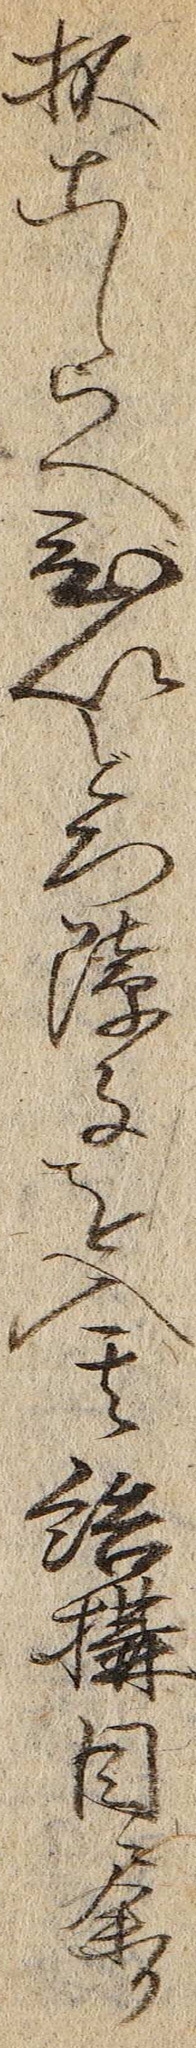などこしらへひいとろ障子を入其結構目に余り
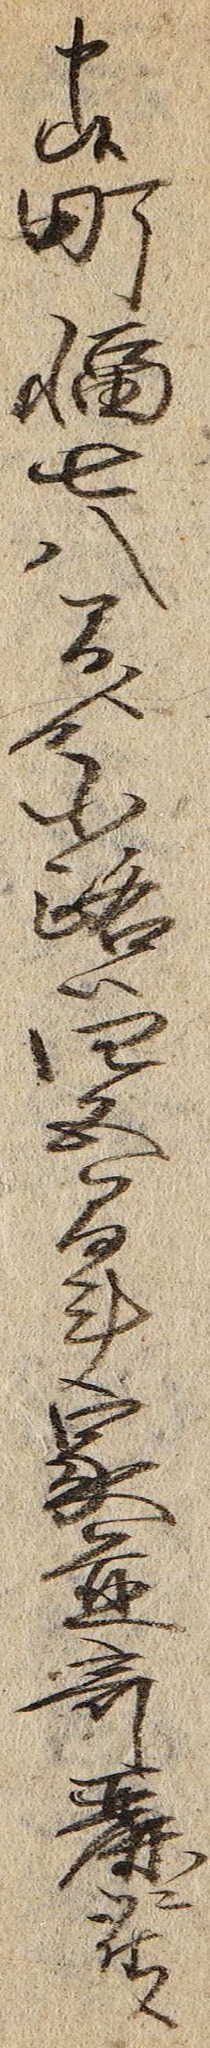申候町幅七八間より小路は四五間斗家並奇麗に御座候
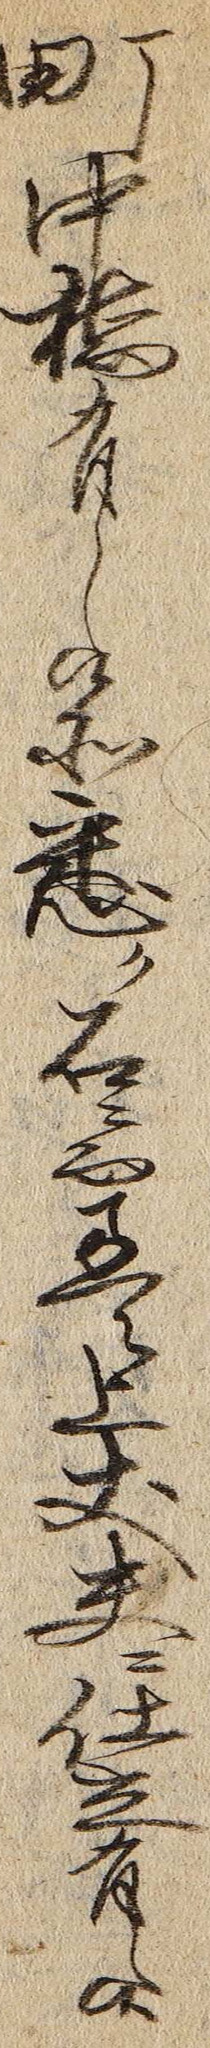町中橋有之候所悉く石にて々上丈夫に仕立有之候
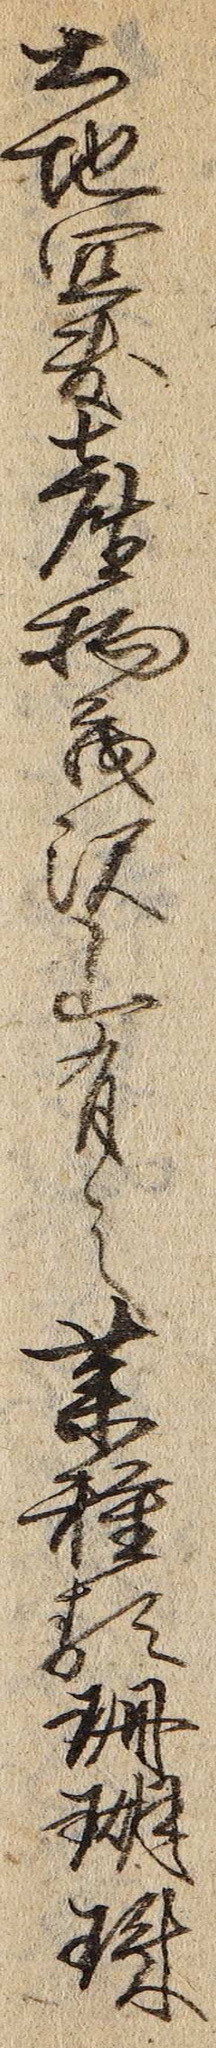土地宜しき産物も沢山有之薬種類珊瑚珠
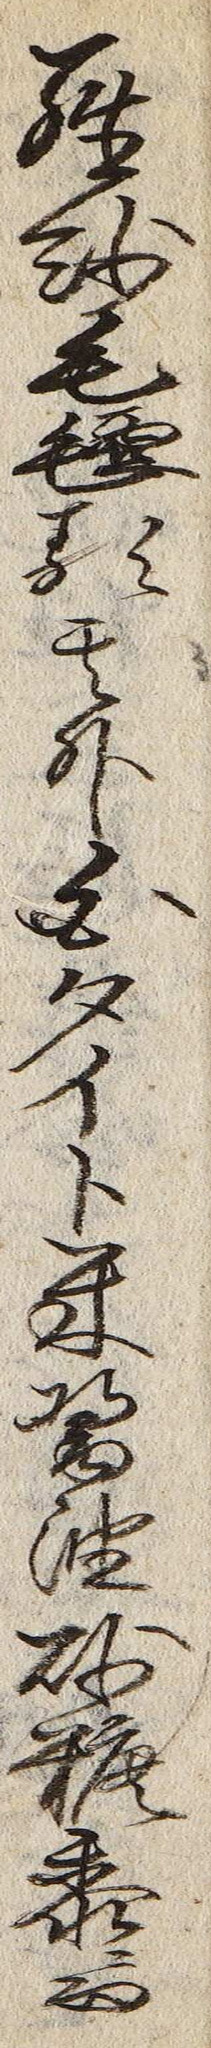羅紗毛氈類其外白タイト米醤油砂糖黍にて
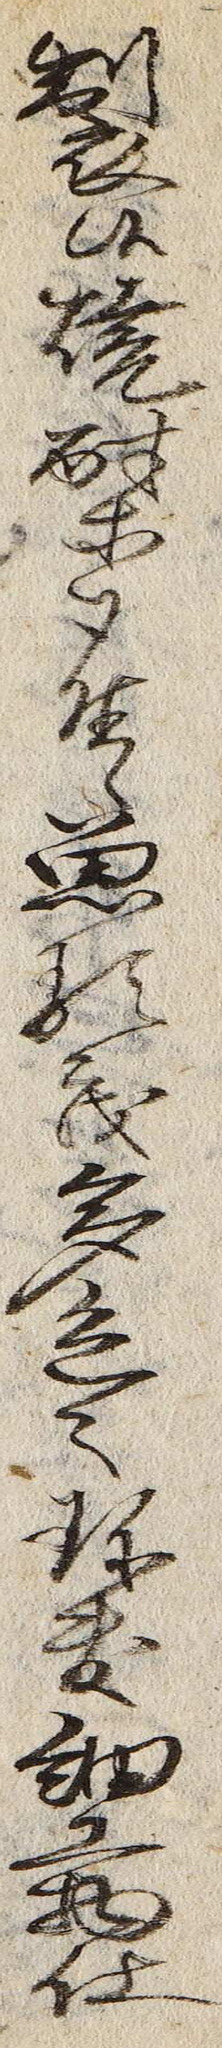製候焼酎等御座候魚類も多色々珍しき細工物仕
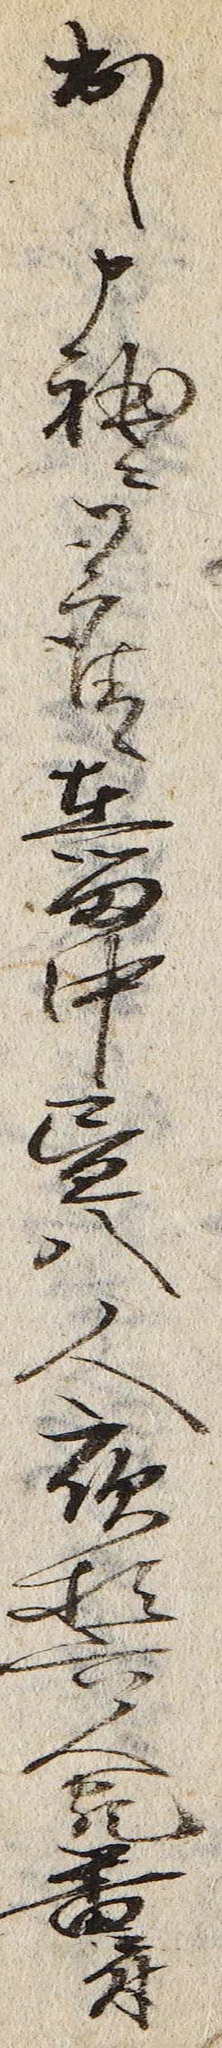出し申体に御座候在留中昼八人夜十六人ずつ番に付
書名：能登国清兵衛異国江漂流之始末
